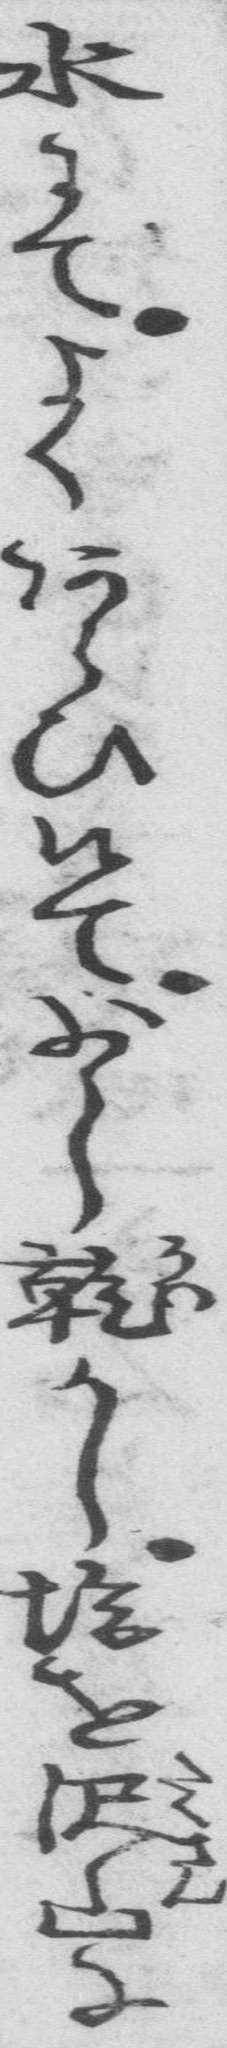水にて。よくあらひ候て。少し乾かし。塩を沢山に
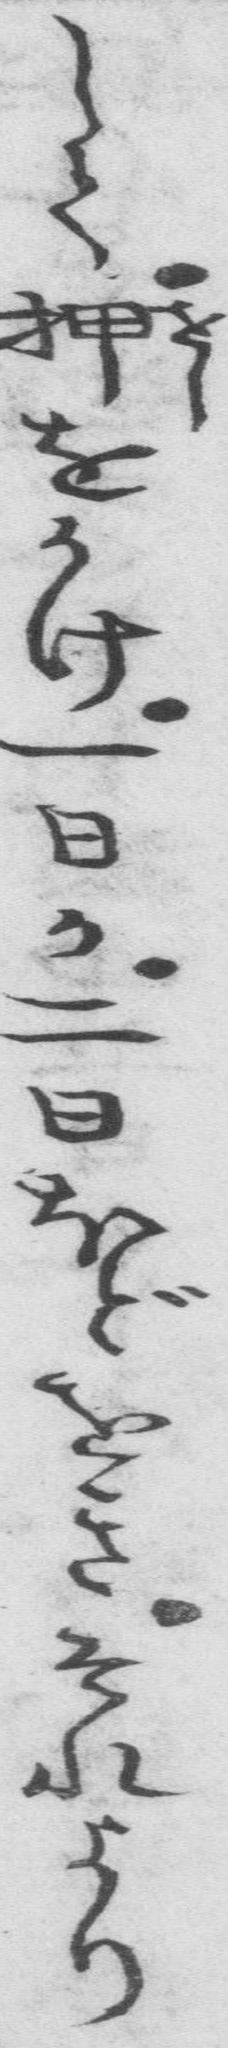して。押をかけ。一日か。二日ほどをき。それより
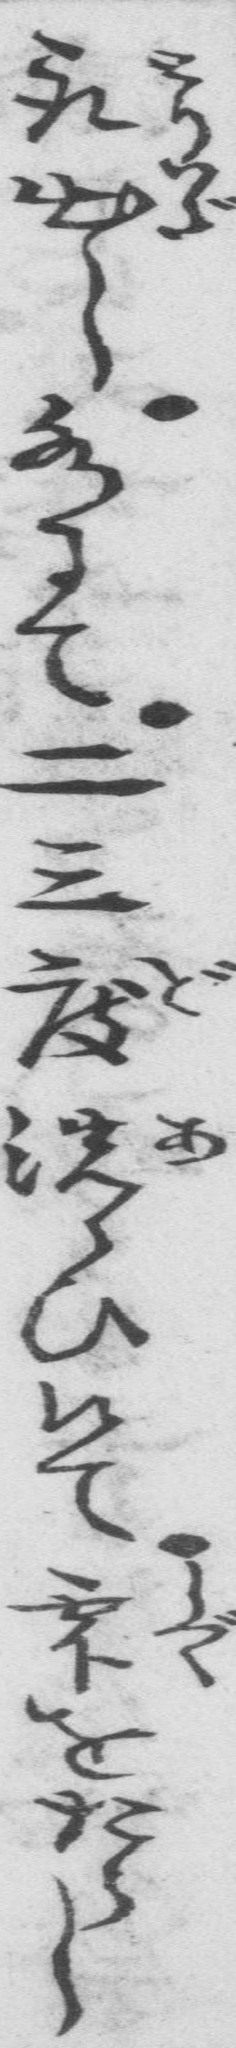取出し。水にて。二三度洗らひ候て。雫をたらし
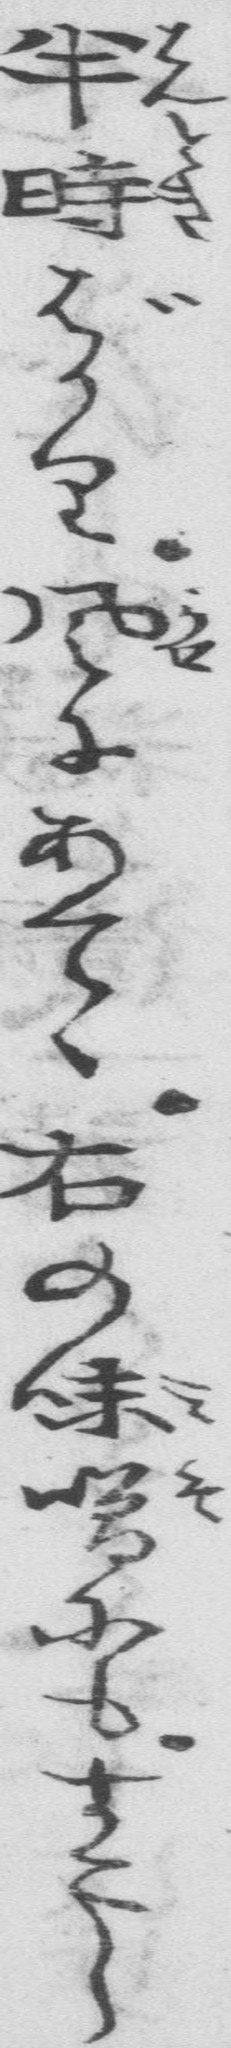半時ばかり。風にあてゝ。右の味噌にも。すこし
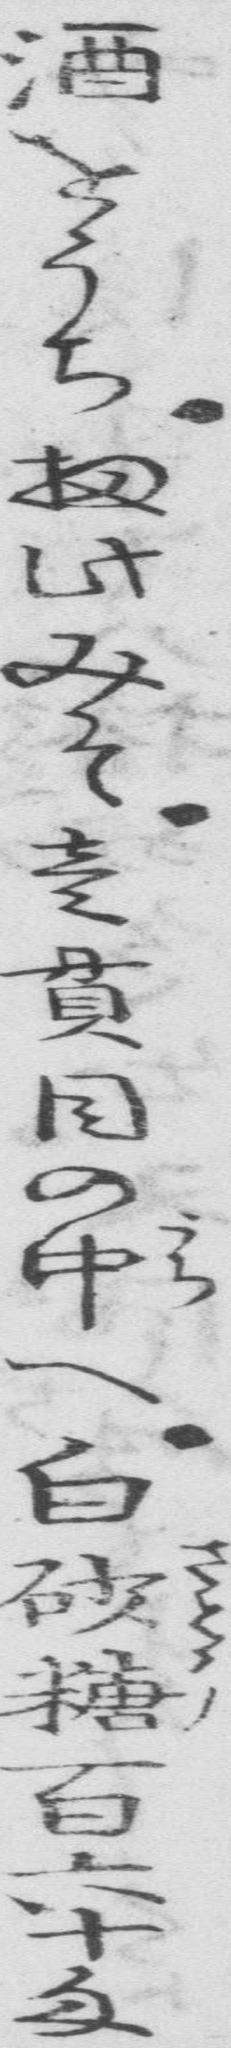酒をうち。扨此みそ。壱貫目の中へ。白砂糖百六十匁
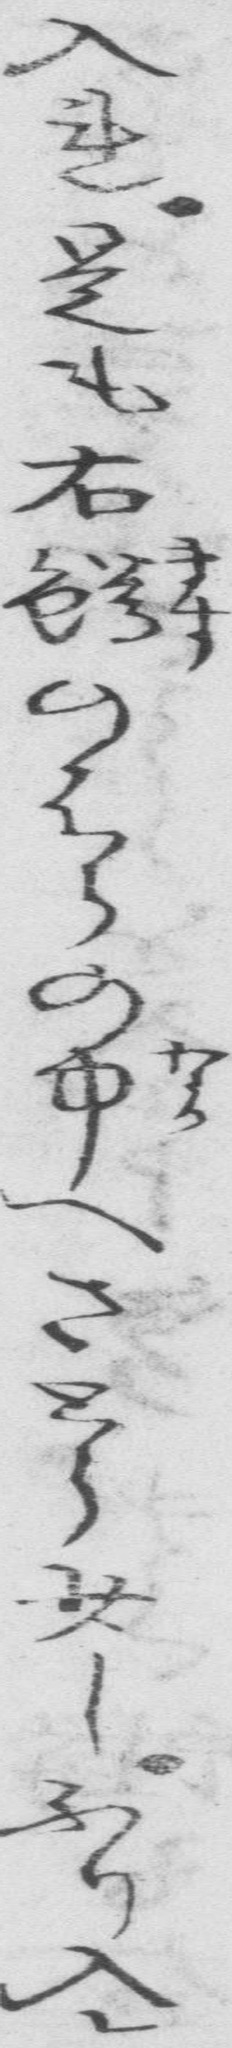入れ。是も右鱒のはらの中へさとう少し。ふり入れ
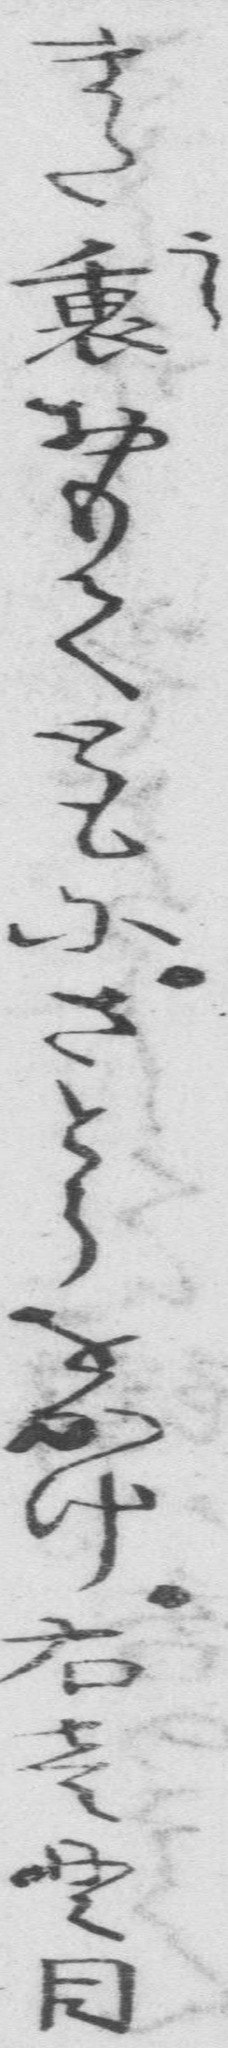また裏おもてともに。さとうをかけ。右壱貫目
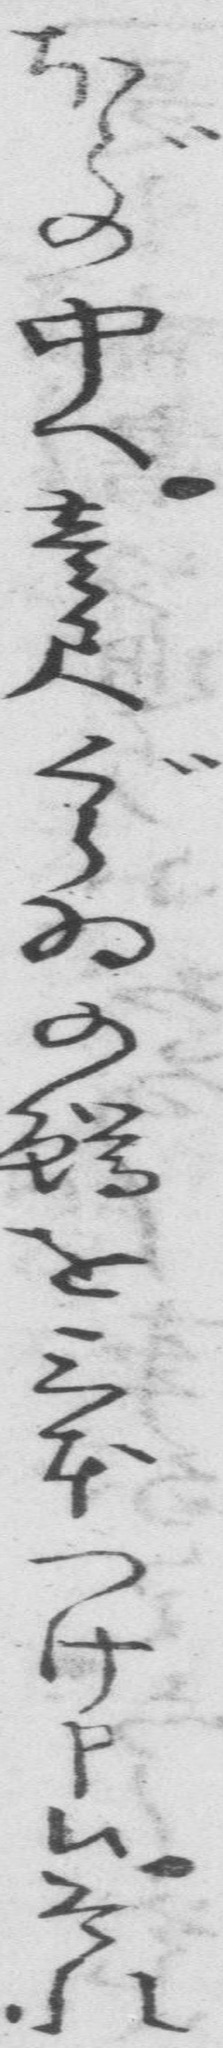ほどの中へ。壱尺ぐらゐの鱒を三本つけ申候。それ
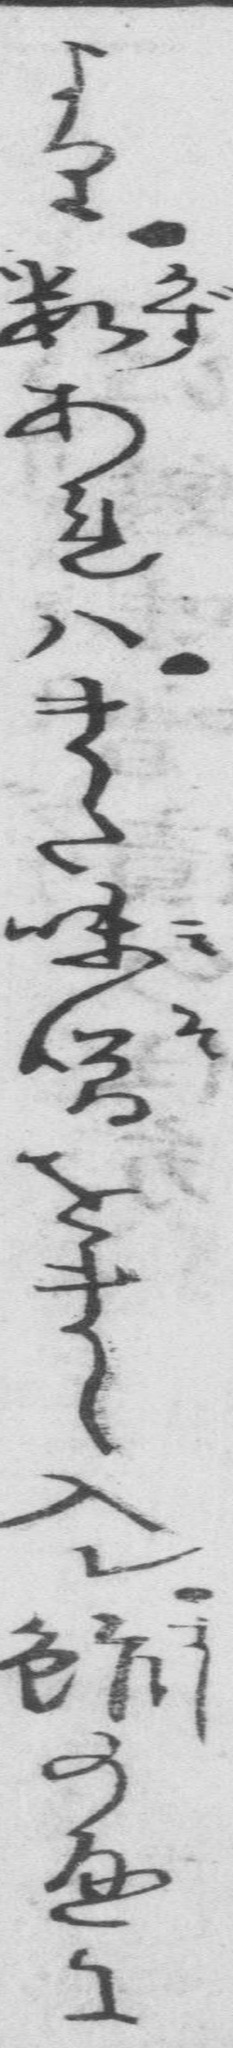より。数あれは。また味噌をまし入れ。鮓の通に
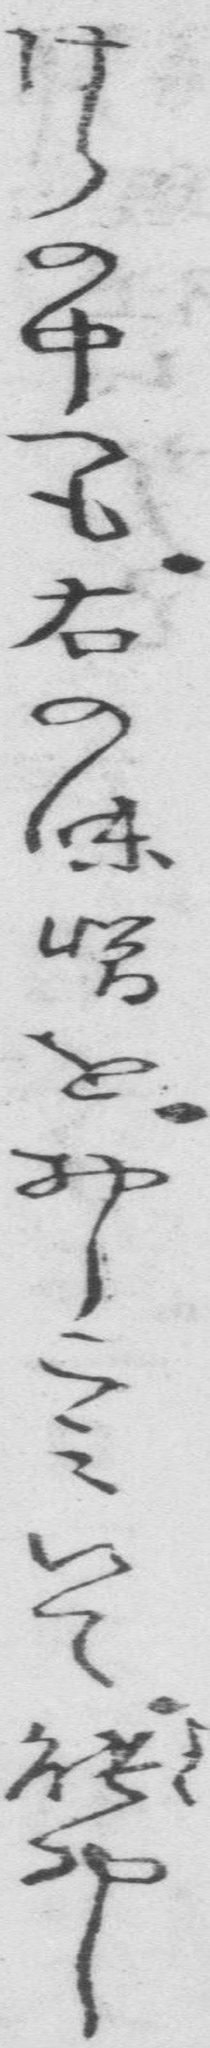はらの中へも。右の味噌を。おしこみ候て。能おし
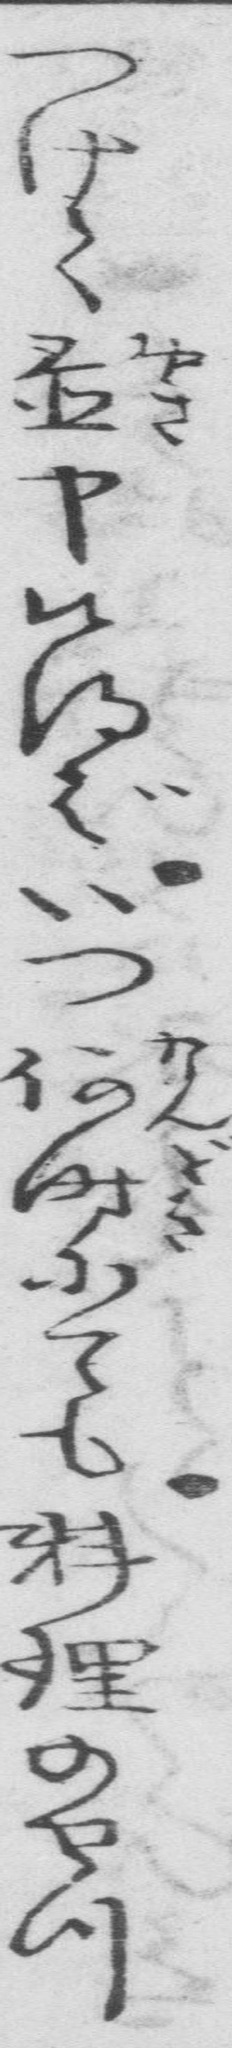つけて置申候得ば。いつ何時にても。料理のせつ
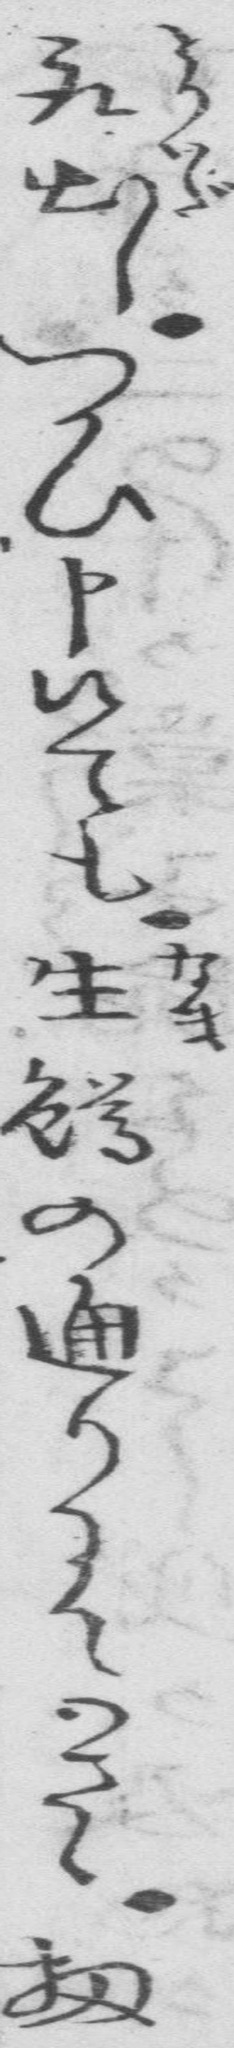取出し。つかひ申候ても。生鱒の通りにて御さ候。扨
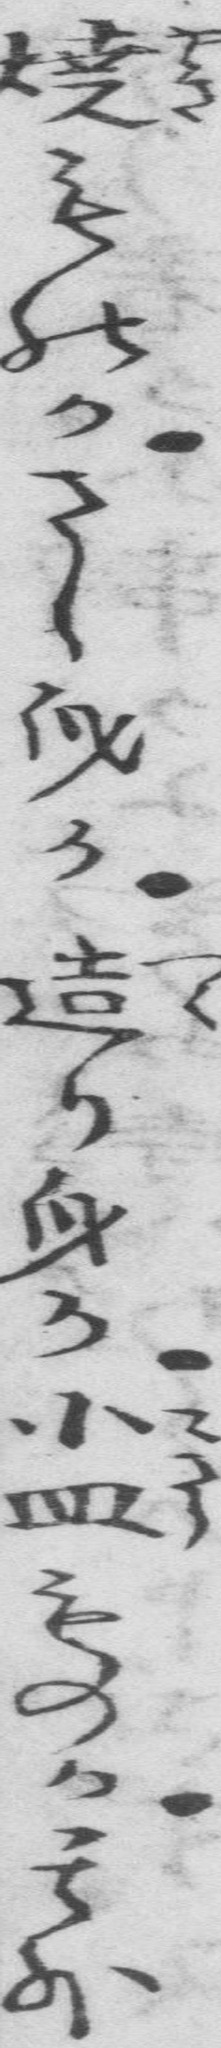焼ものか。さし身か。造り身か。小皿ものか。其外

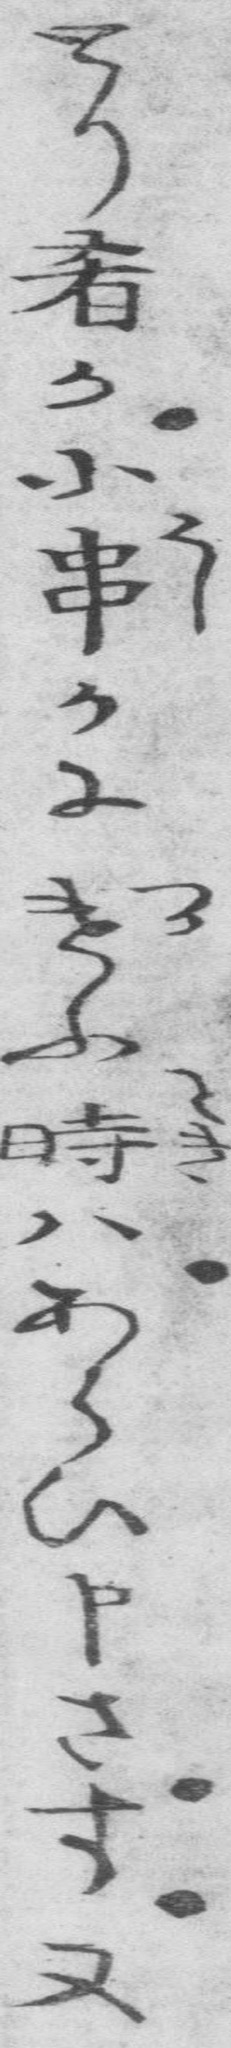とり肴か。小串かに遣ふ時は。あらひ申さず。又
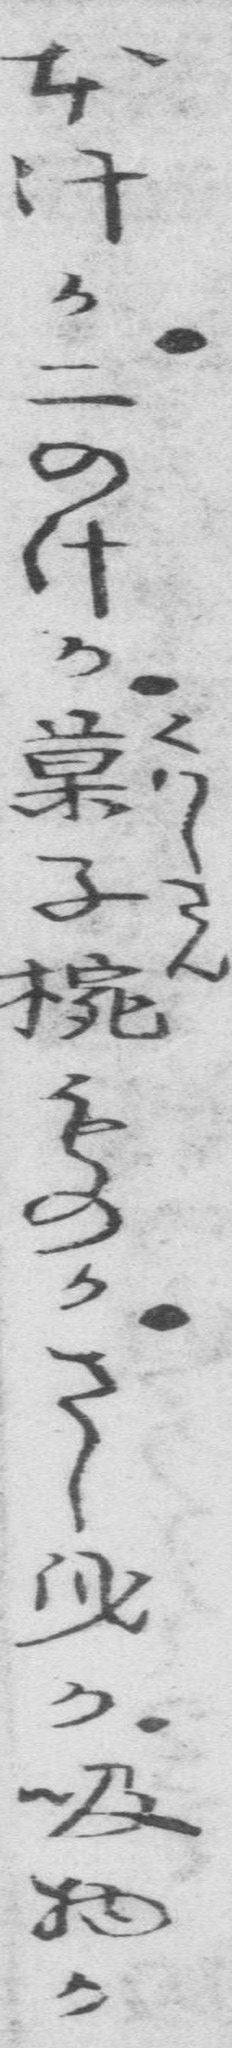本汁か。二の汁か。菓子椀ものか。さし身か。吸物か
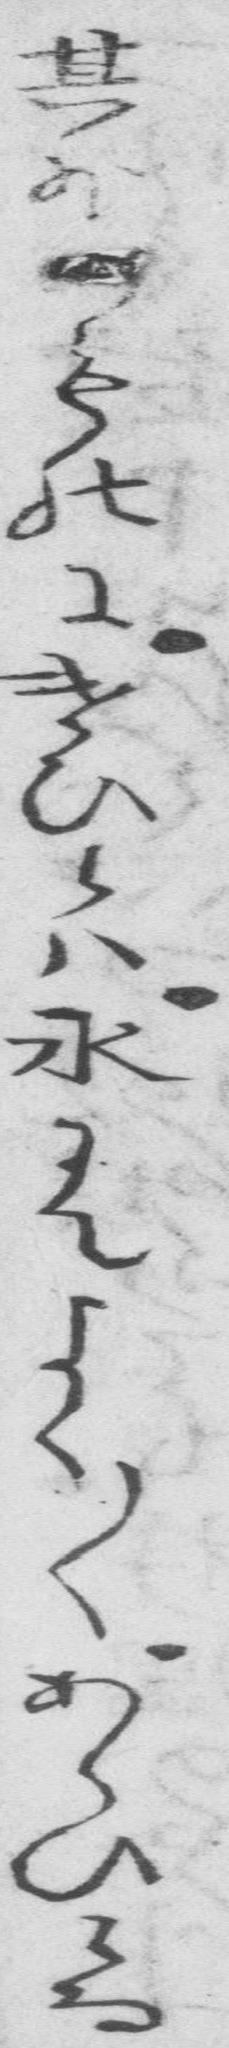其外のものに。遣ひ候は。水にてよく〳〵。あらひに而
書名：萬寳料理秘密箱
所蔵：大阪府立大学学術情報センター 国文学研究資料館
